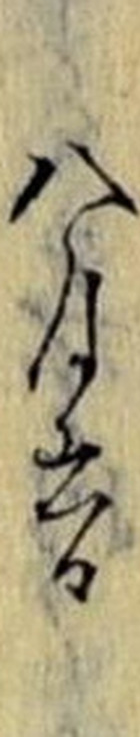八月六日
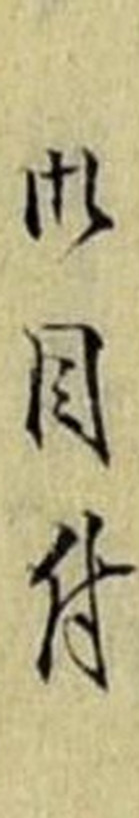御目付
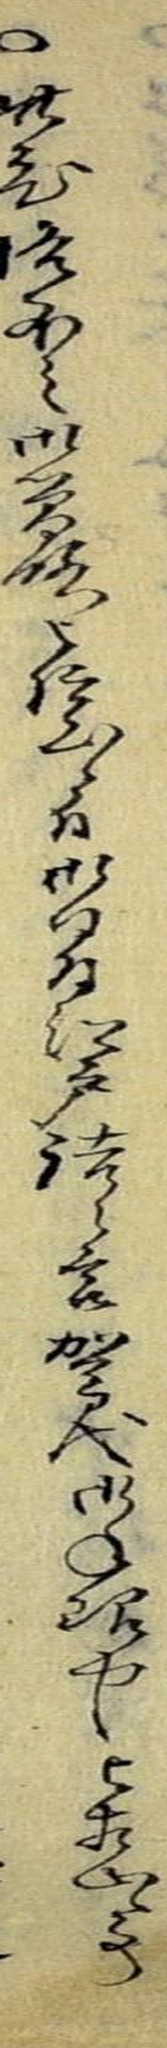○此度格外之御簡略被仰出候に付御目付江戸詰之節駕代御年限中被相止候事
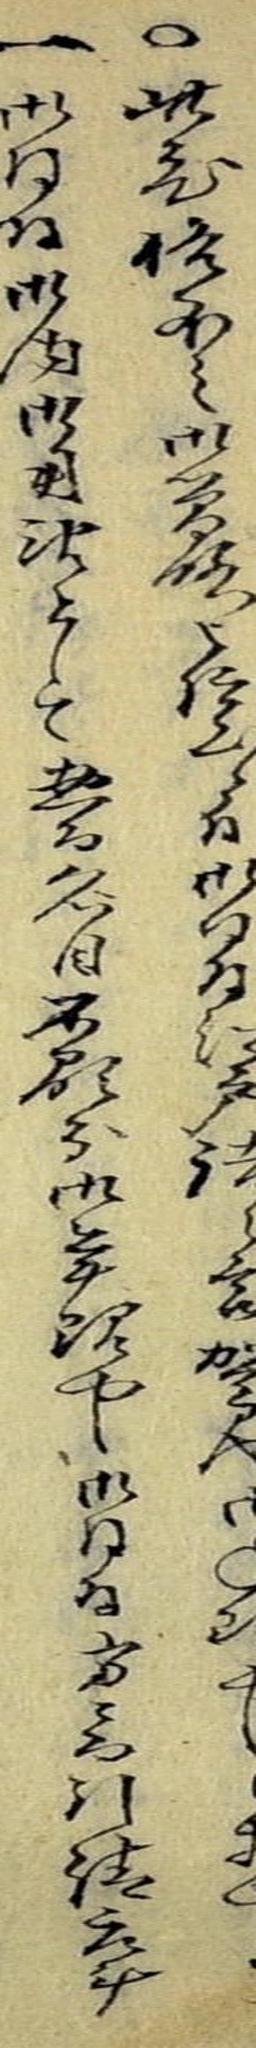一御目付御内御用銀として惣而名目不顕分御年限中御目付方に而引請取斗
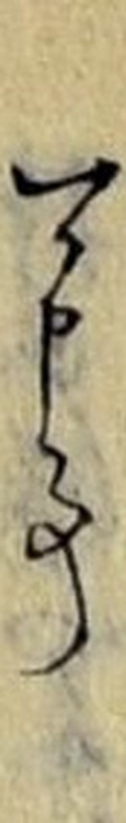可申事
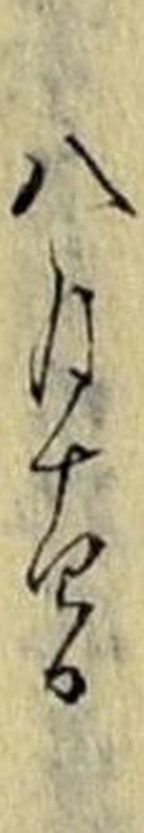八月十四日
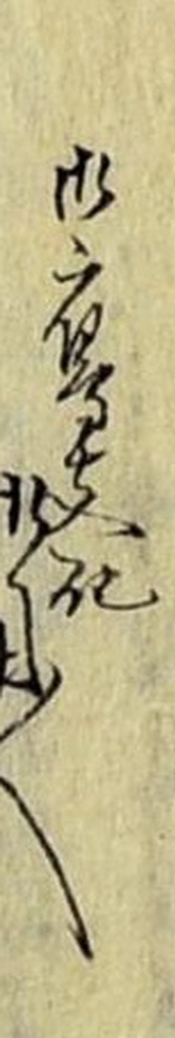御用人
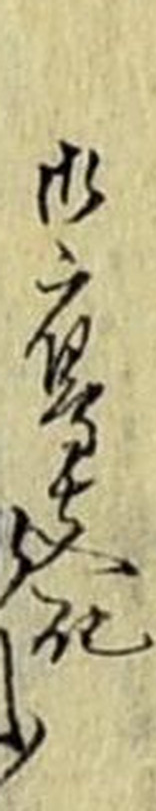御鷹支配
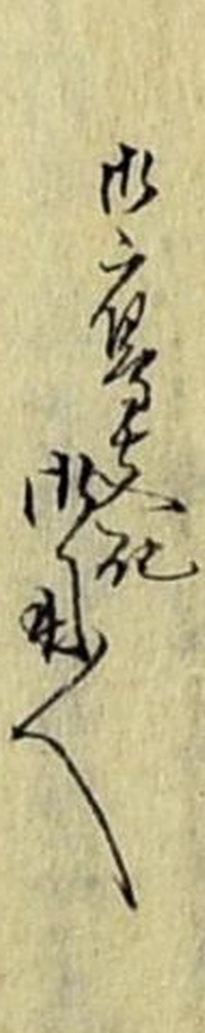御用人
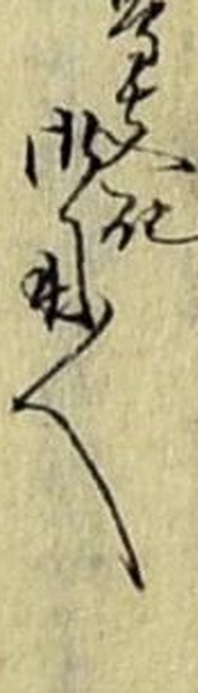御用人
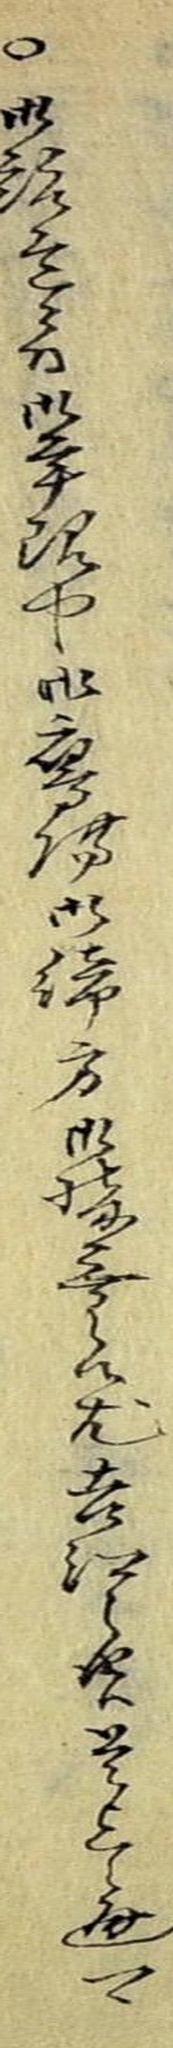○御趣意に付御年限中御鷹場御締方御構無之候尤吉江之儀は是迄之通可
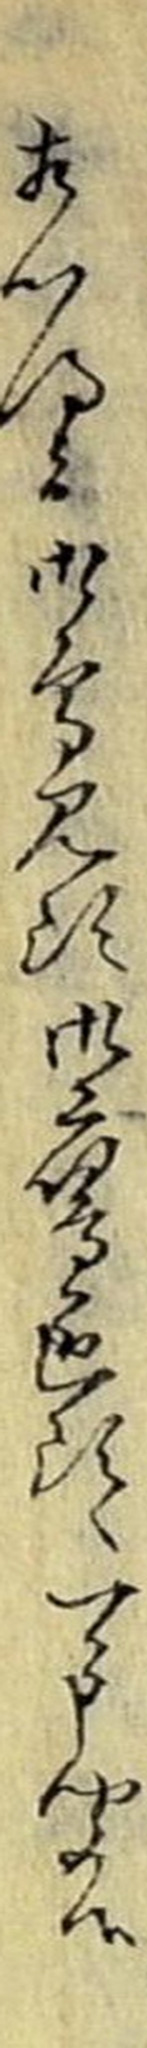相心得旨御鳥見頭御鷹匠頭へ可申聞候
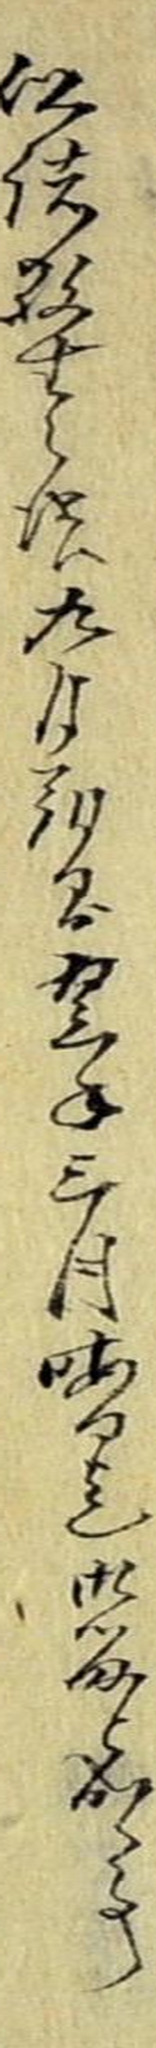但諸殺生之儀は九月朔日ゟ翌年三月晦日迄御留被成候事
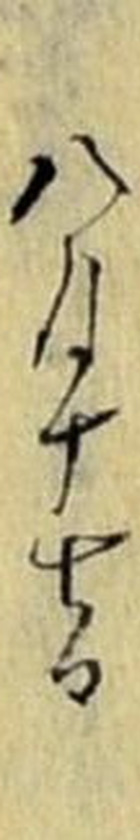八月十七日

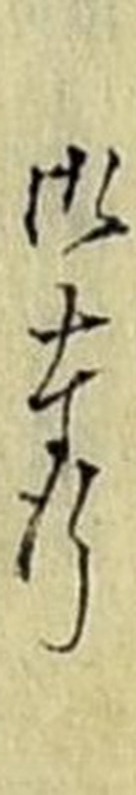御奉行
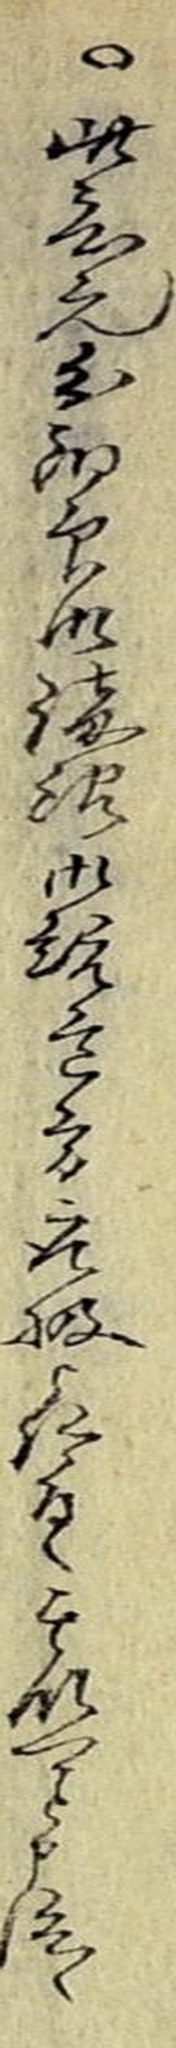○此度元分銅印御講銀御趣意方取扱被仰付候其段可被申渡候
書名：命令之部 六
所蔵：福井県文書館 Fukui Prefectural Archives
